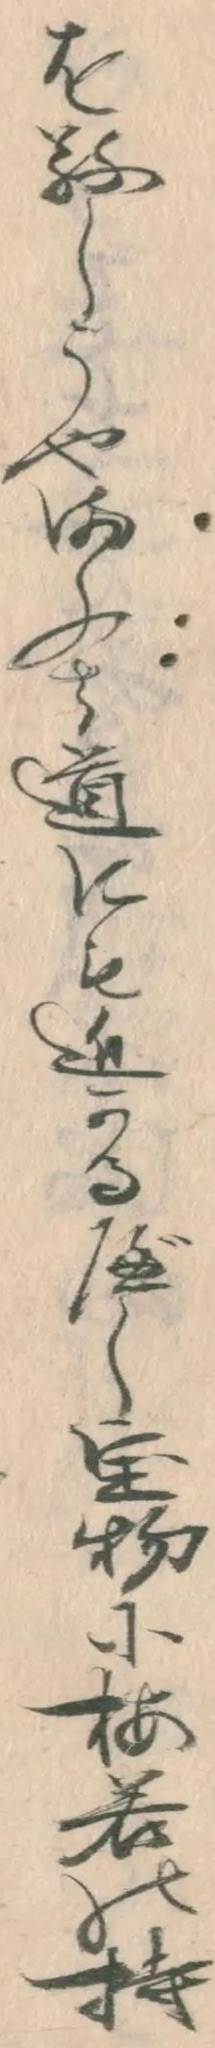を敬しうやまふは道にも近かるべし宝物に梅若の持
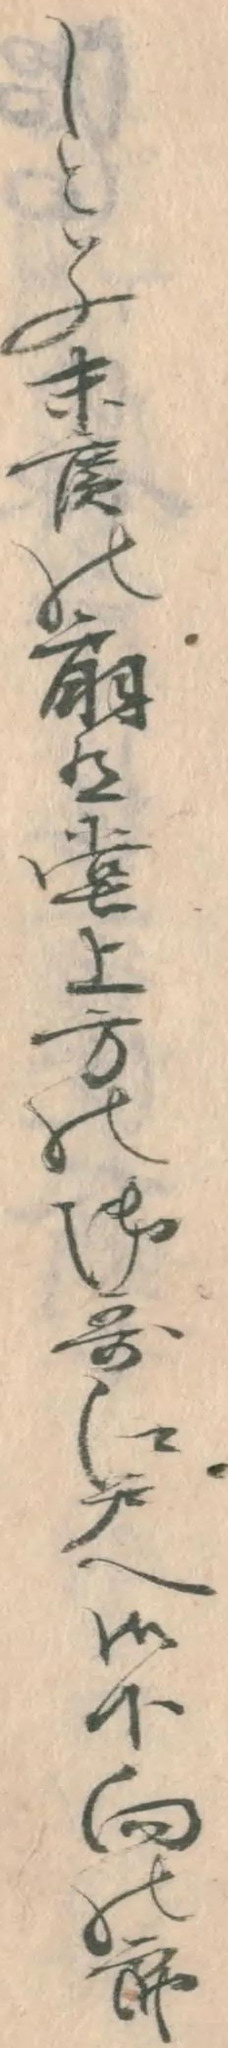しといふ末広の扇有堂上方の御哥江戸へ御下向の節

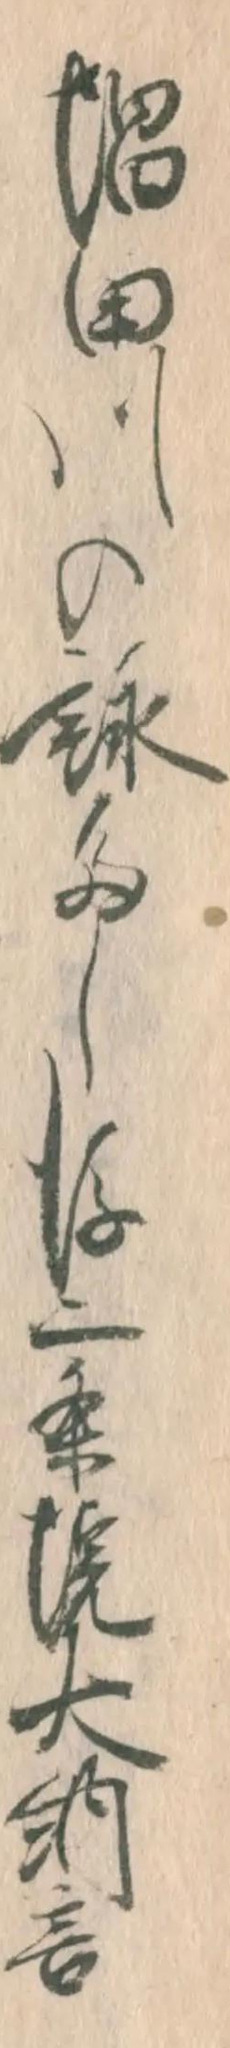隅田川の詠多し後二条院大納言
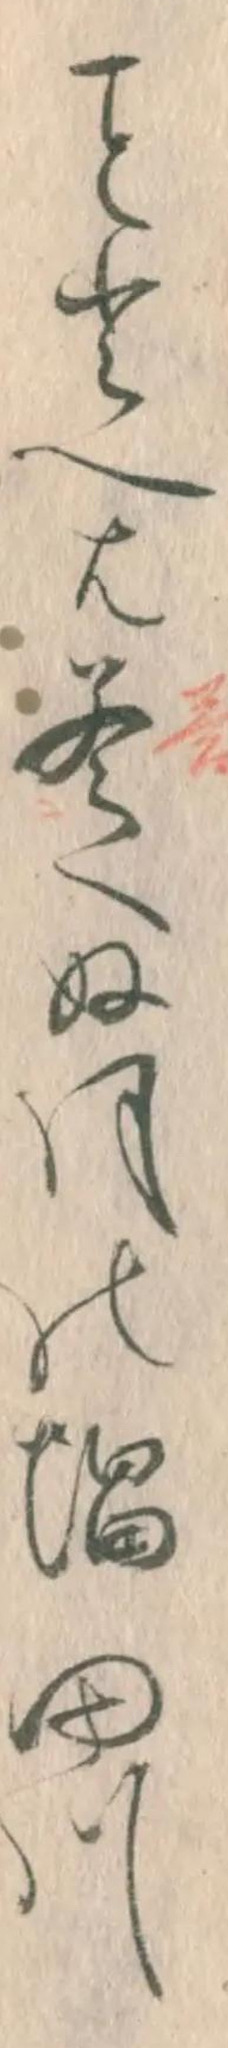こととへは答へぬ月の隅田川
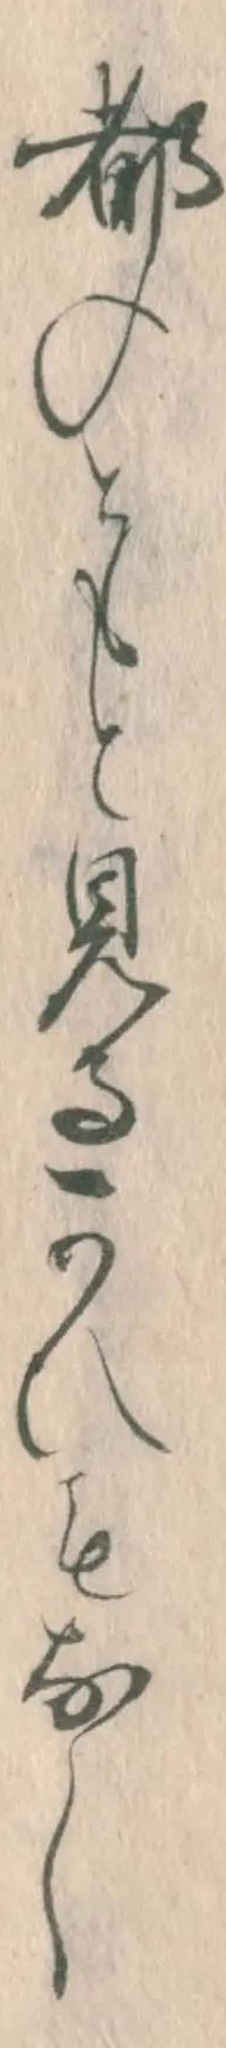都のともと見るかひもなし
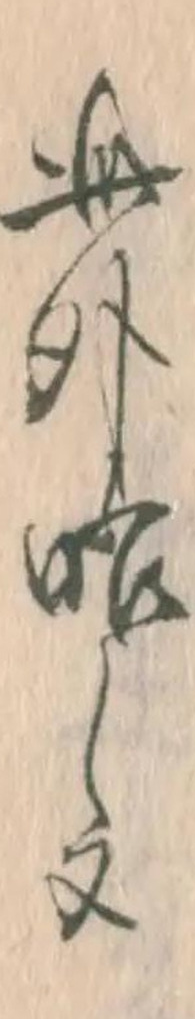此外略しぬ
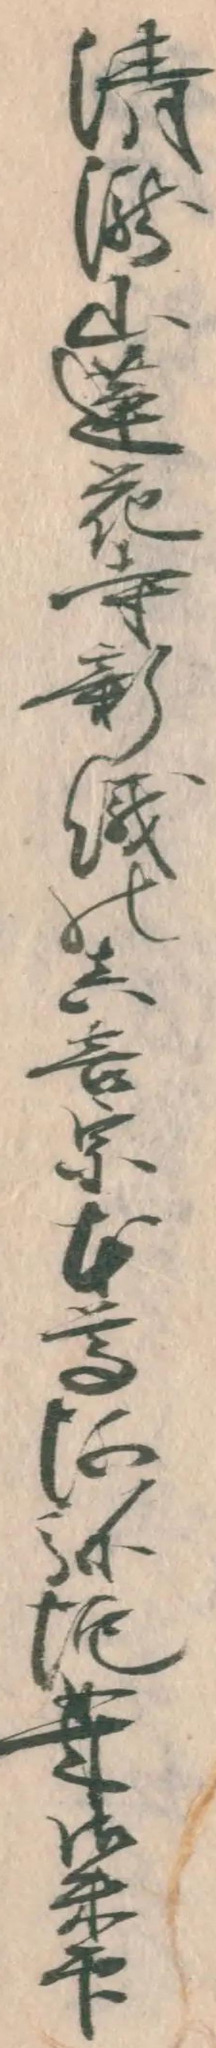清滝山連花寺新儀の真言宗本尊阿弥陀如来御朱印
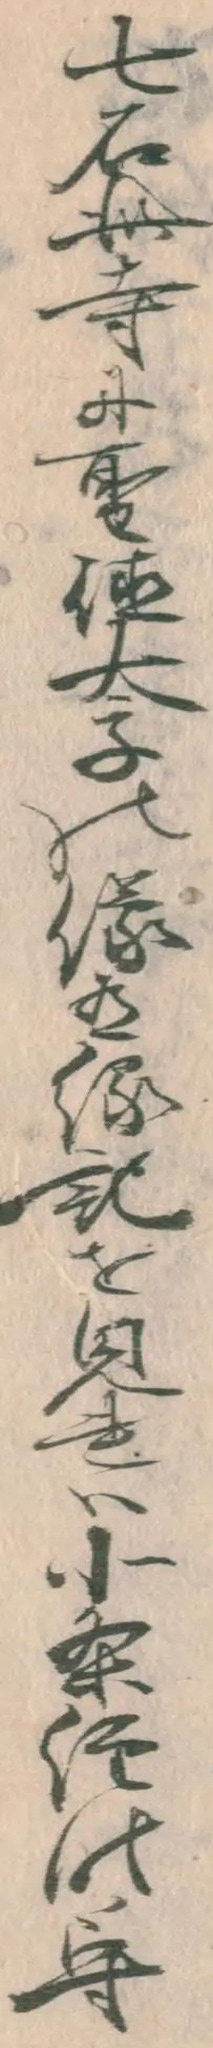七石此寺に聖徳大子の像有縁記を見れは北条経時の守
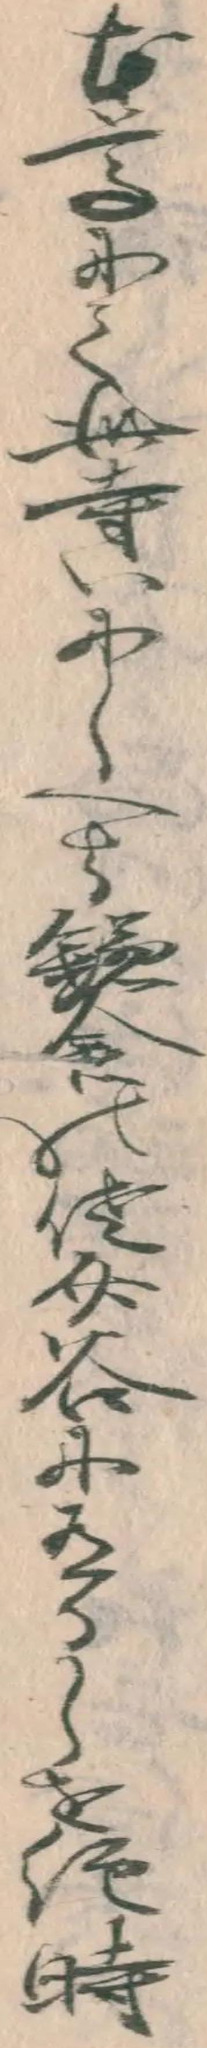本尊にて此寺いにしへは鎌倉の佐介谷に有りしを経時
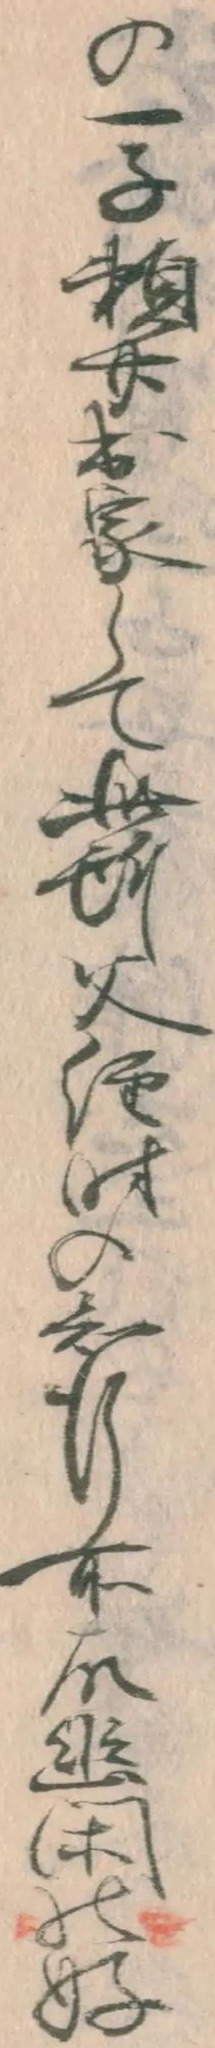の一子頼介出家して此所父経時の知行所故有閑の好
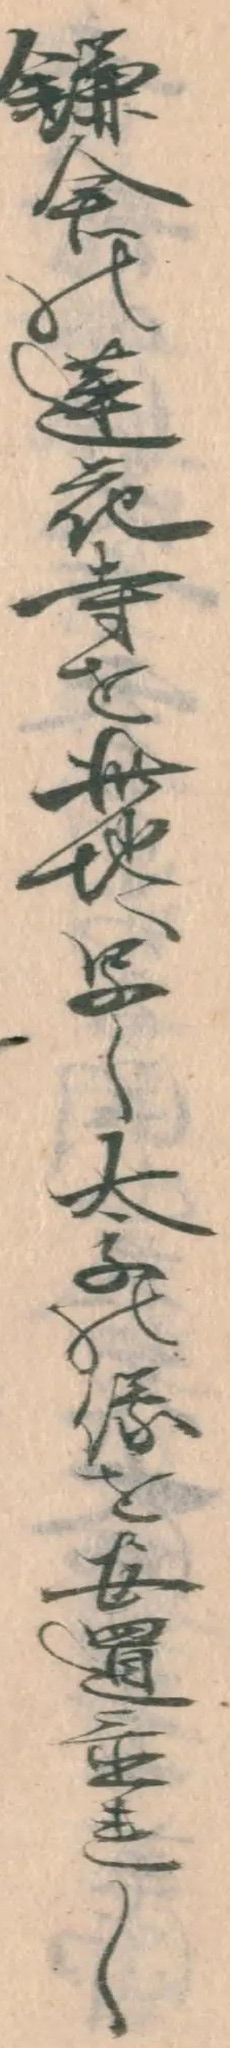鎌倉の蓮花寺を此地へ写し大子の像を安置れし
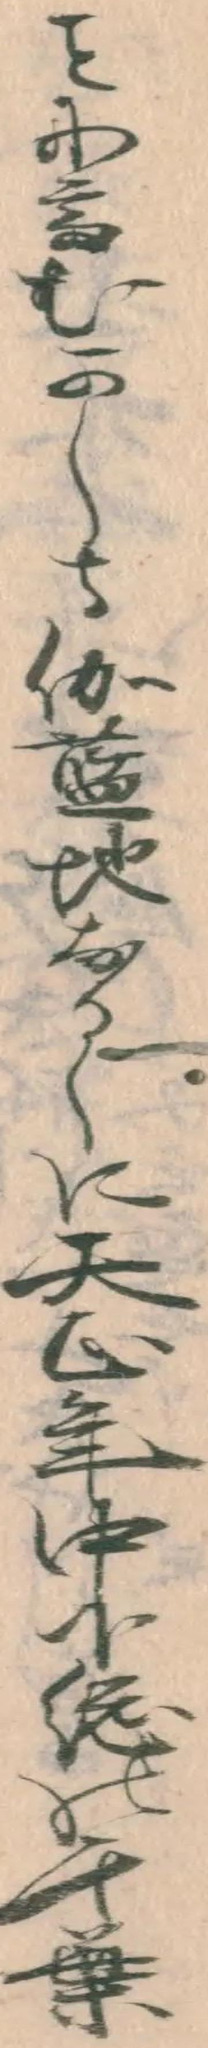ことにてむかしは伽藍地なりしに天正年中下総の千葉
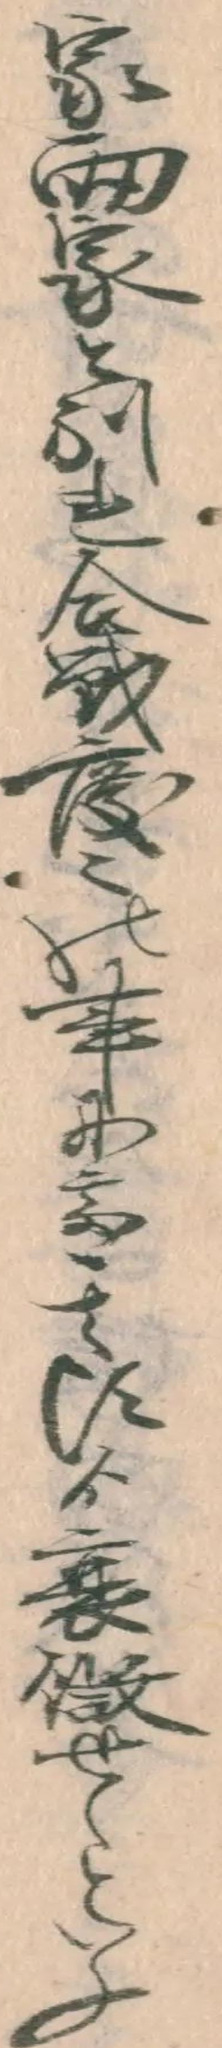家両家と別れ合戦度々の事にて其頃より衰微せしといふ
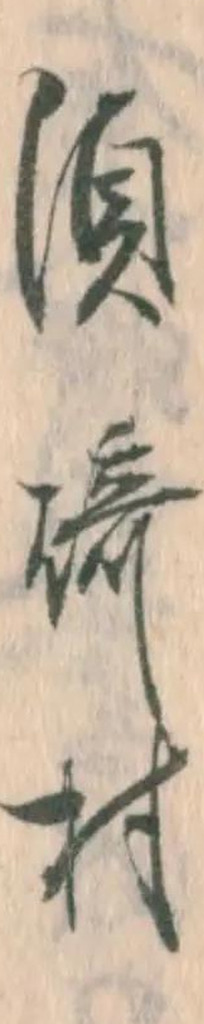須崎村
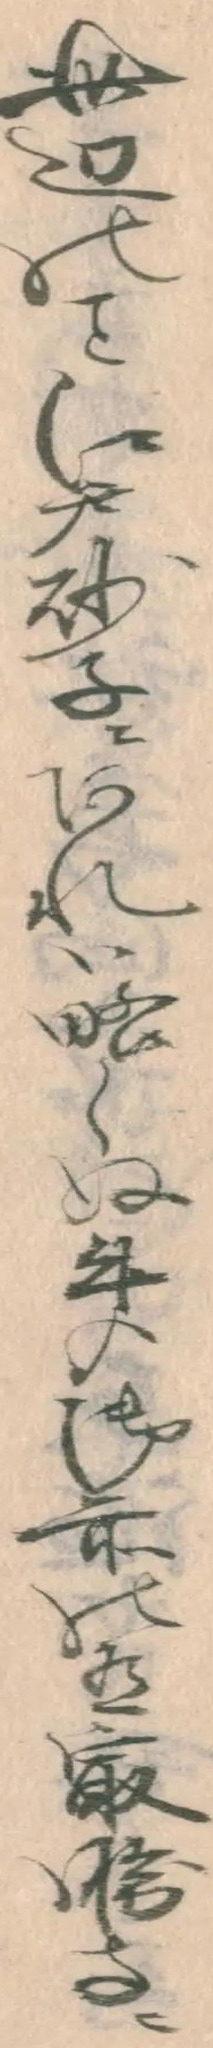此辺のこと江戸砂子にあれは略しぬ牛の御前の有最勝寺に
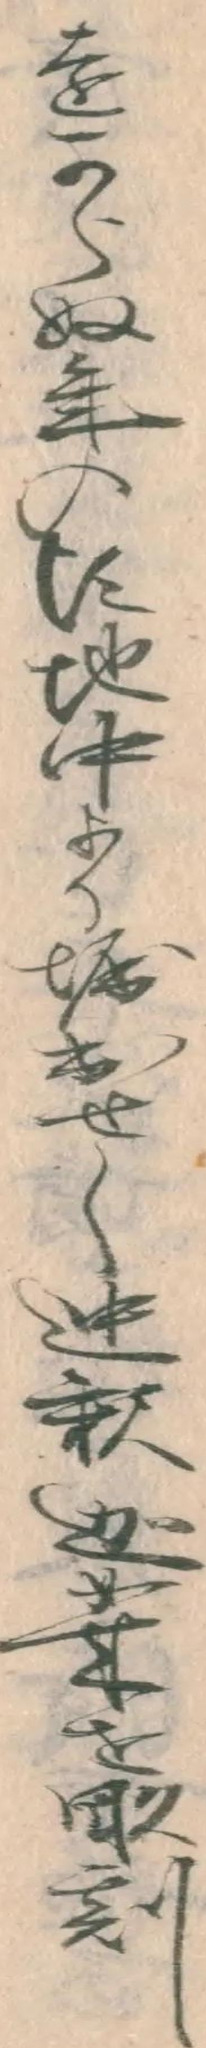遠からぬ年の頃地中より堀出せし迚釈迦菜を彫刻
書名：四神地名録 6巻. [4]葛飾郡
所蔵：国立国会図書館 National Diet Library, JAPAN
